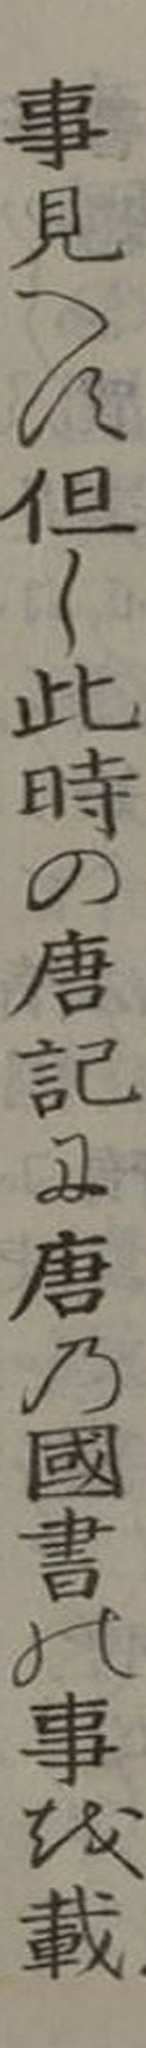事見へす但し此時の唐記に唐の國書の事を載
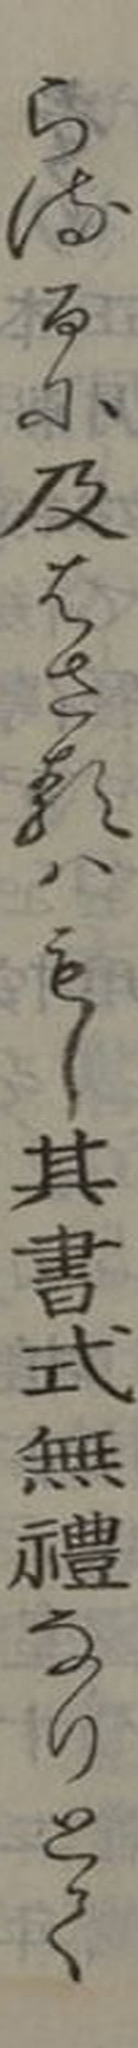らるるに及はさるハもし其書式無禮なりとて
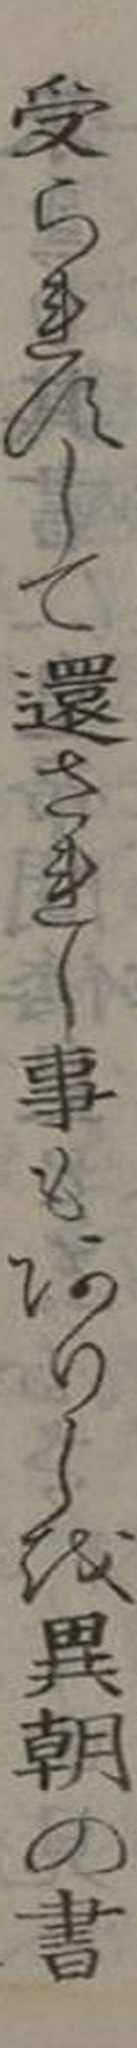受られすして還されし事もありしを異朝の書
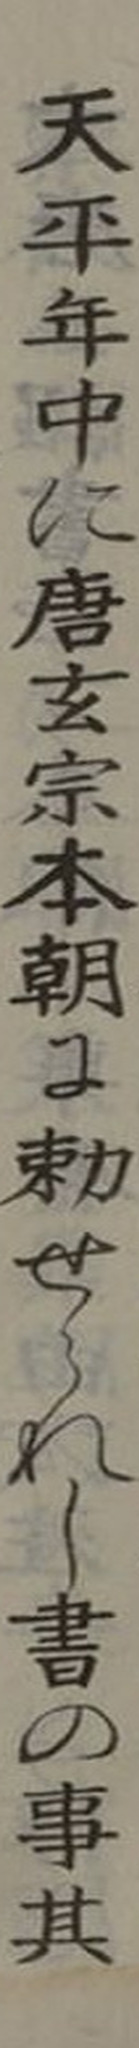天平年中に唐玄宗本朝に勅せられし書の事其
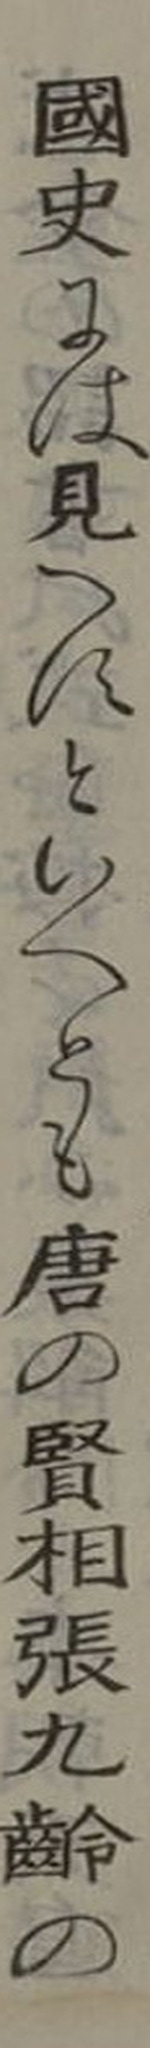國史には見へすといへとも唐の賢相張九齡の
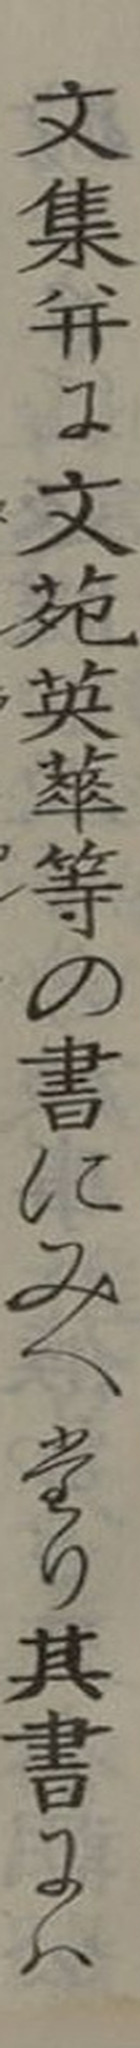文集并に文苑英𦶎等の書にみへたり其書にハ
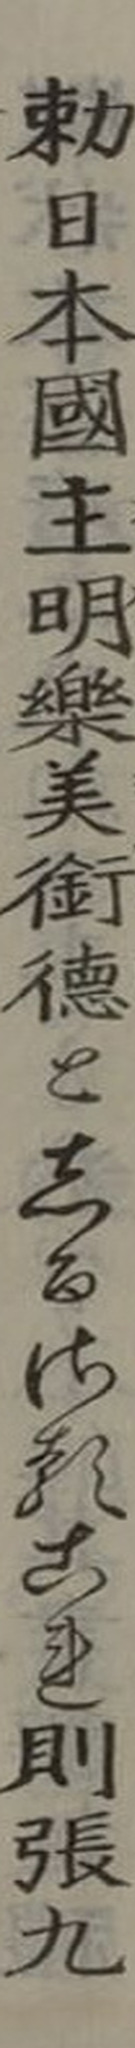勅日本國主明樂美樹徳としるさるこれ則張九
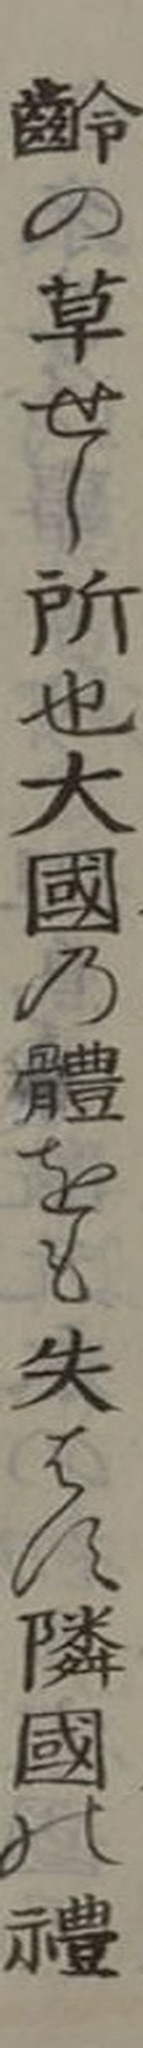齡の草せし所也大國の體をも失はす隣國の禮
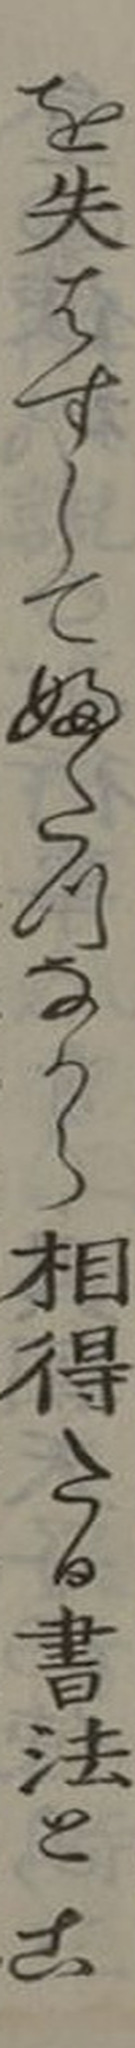を失はすしてふたつなから相得たる書法とこ

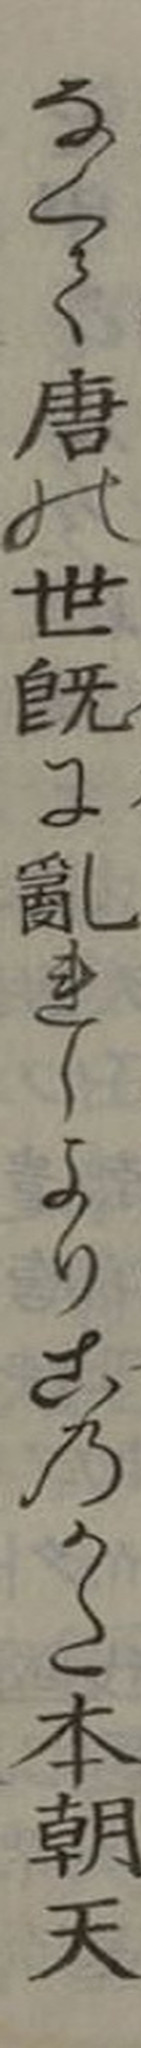なくて唐の世既に亂れしよりこのかた本朝天
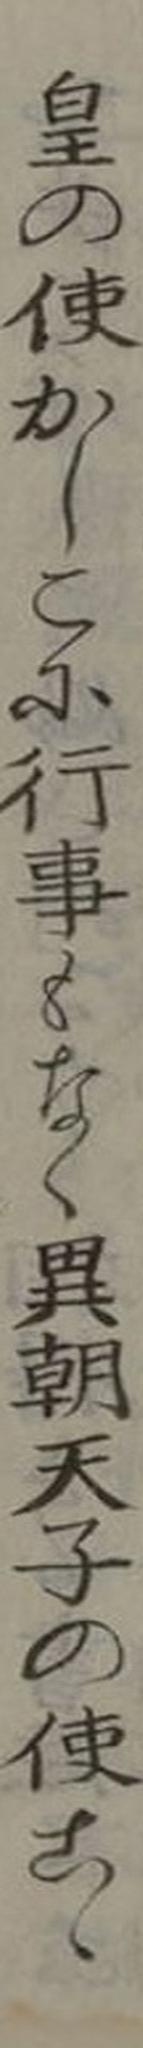皇の使かしこに行事もなく異朝天子の使こゝ
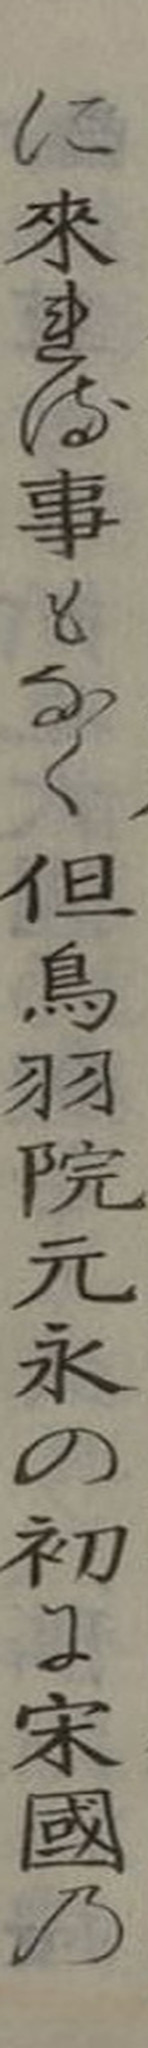に來れる事もなく但鳥羽院元永の初に宋國の
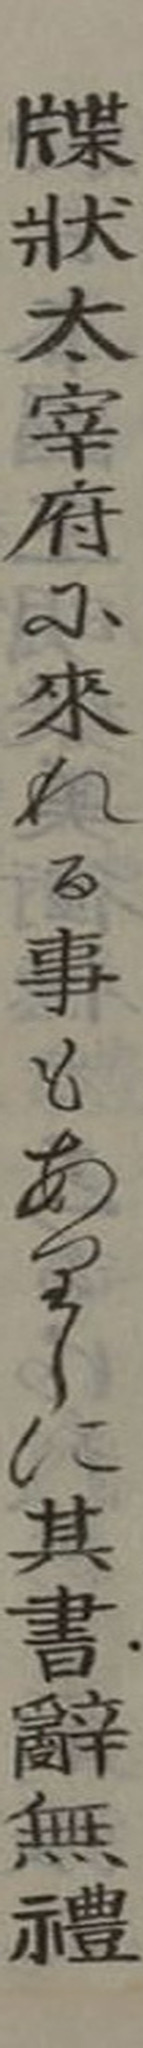牒狀太宰府に來れる事もありしに其書辭無禮
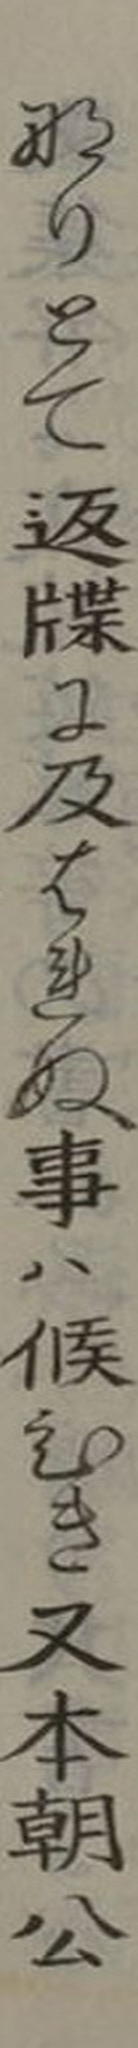なりとて返牒に及はれぬ事ハ候むき又本朝公
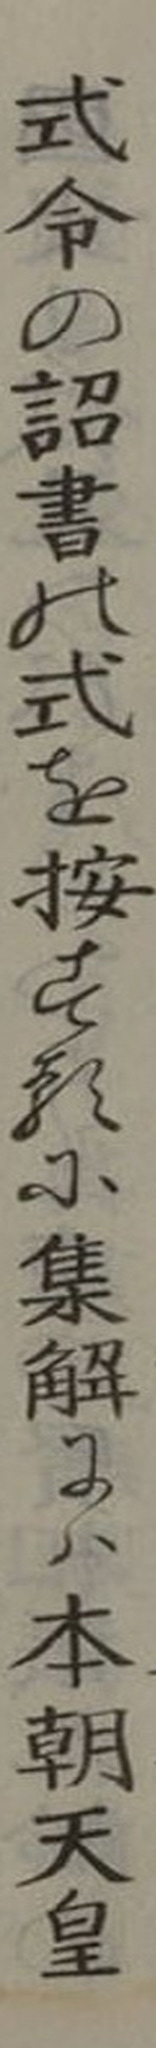式令の詔書の式を按するに集解にハ本朝天皇
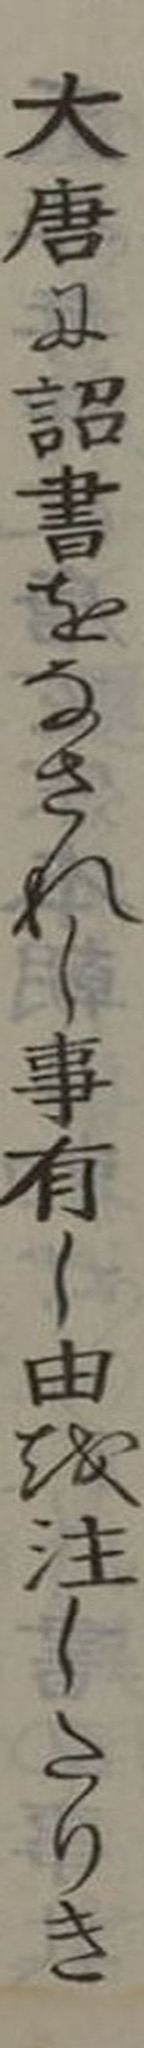大唐に詔書をなされし事有し由を注したりき
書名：骨董録
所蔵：University of the Ryukyus Library
